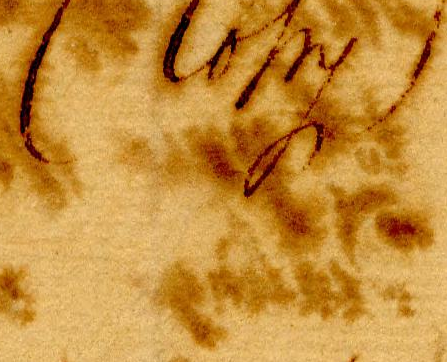(Copy)
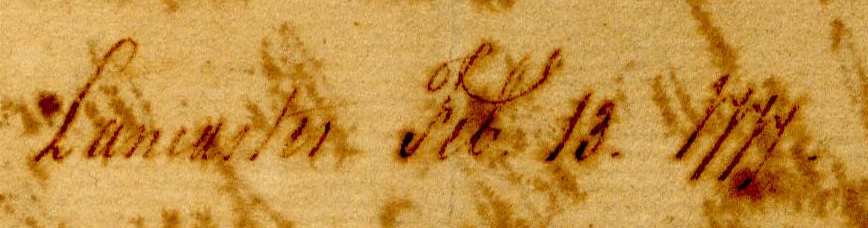Lancaster Feb. 13. 1777.
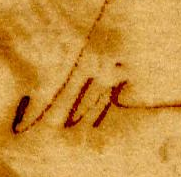Sir
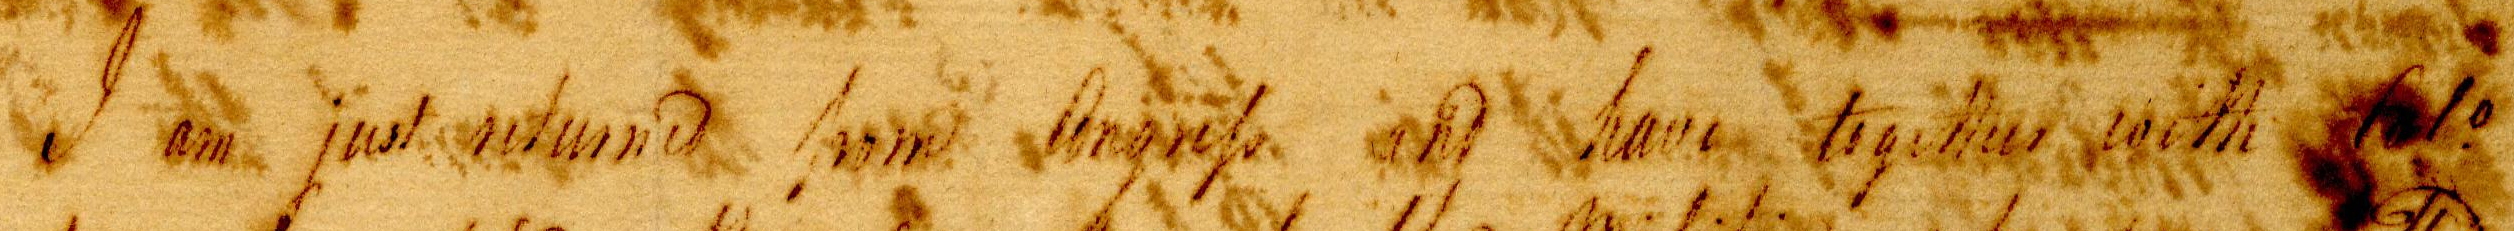I am just returned from Congress and have together with Col^o
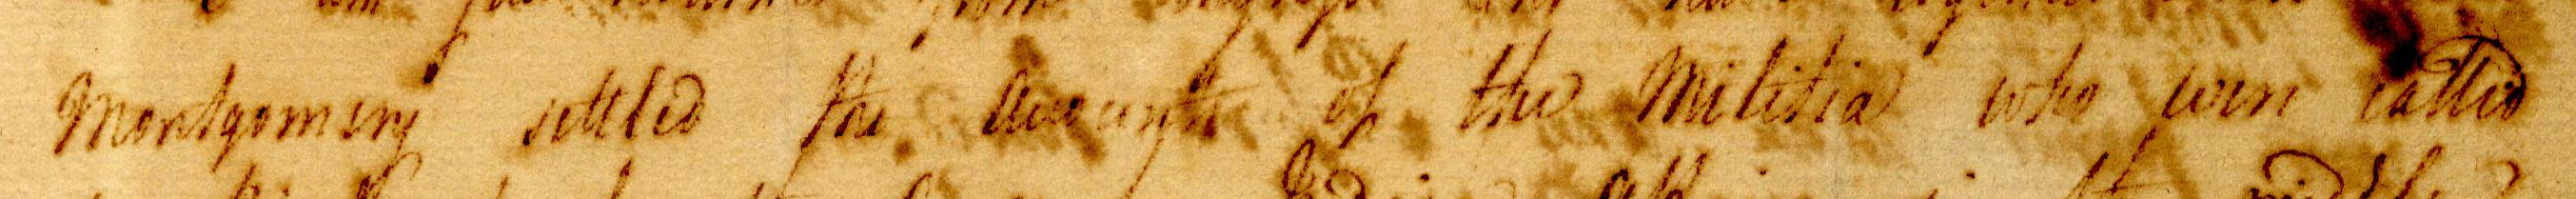Montgomery settled the accounts of the Militia who were called
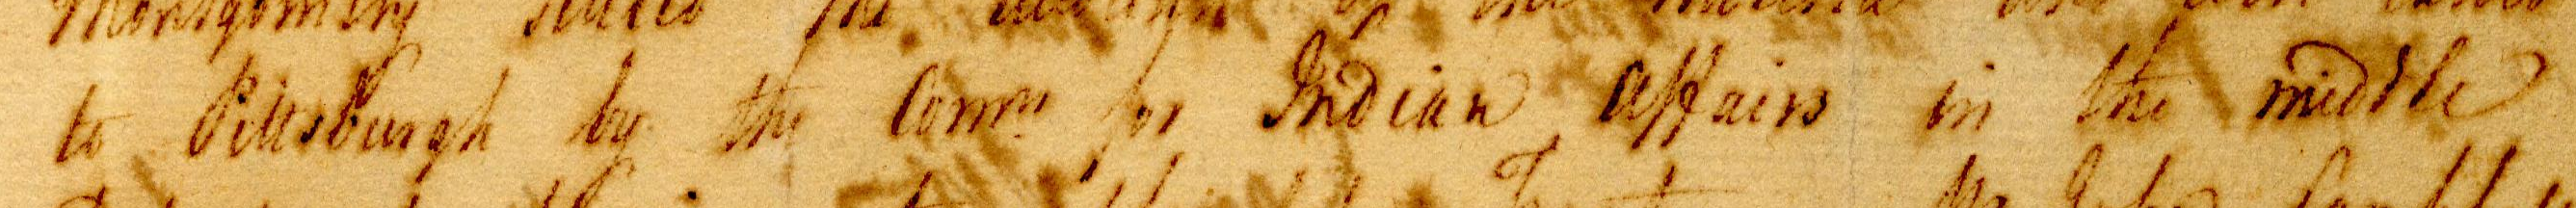to Pittsburgh by the Com^n for Indian Affairs in the middle
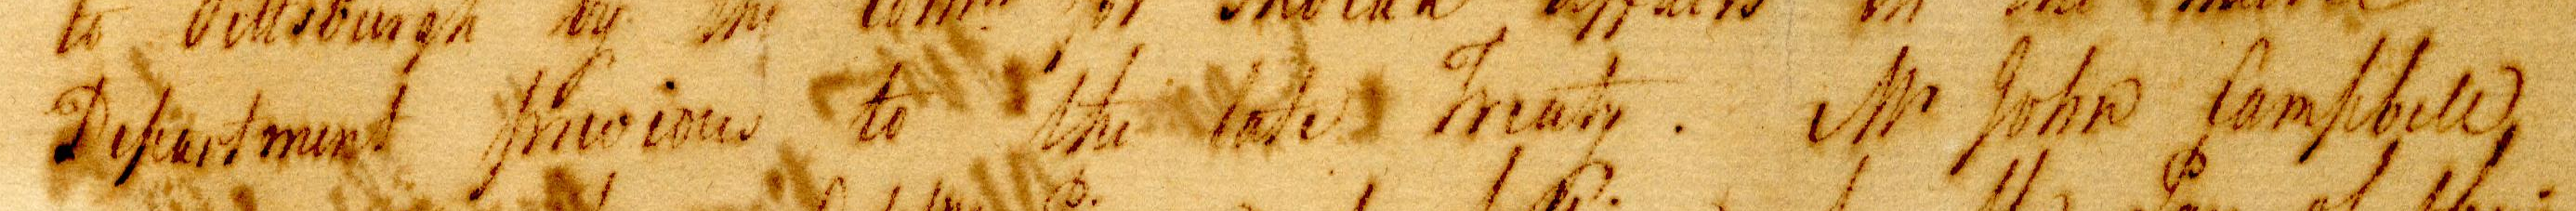Department previous to the late Treaty. M^r John Campbell
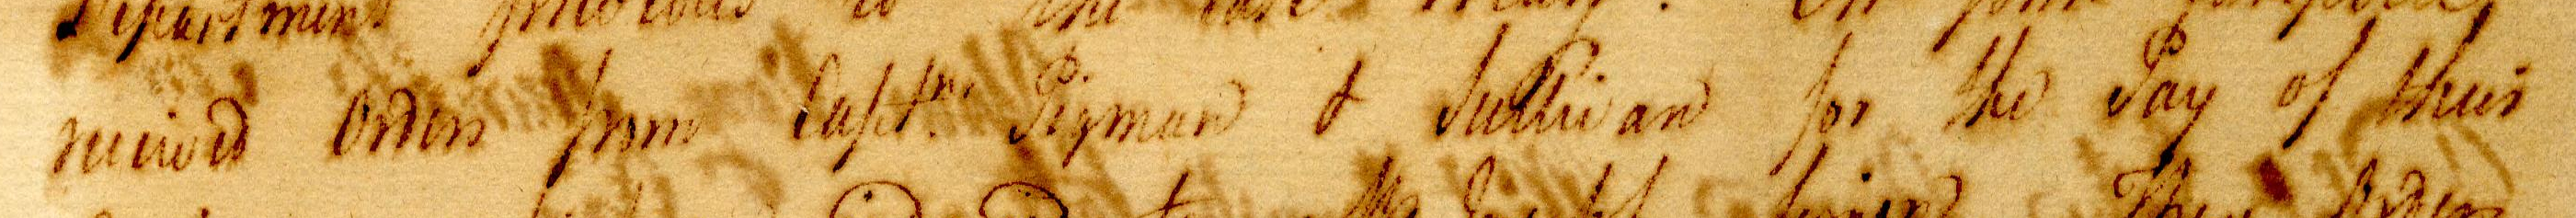received Orders from Cap^t. Pigman & Sullivan for the Pay of their
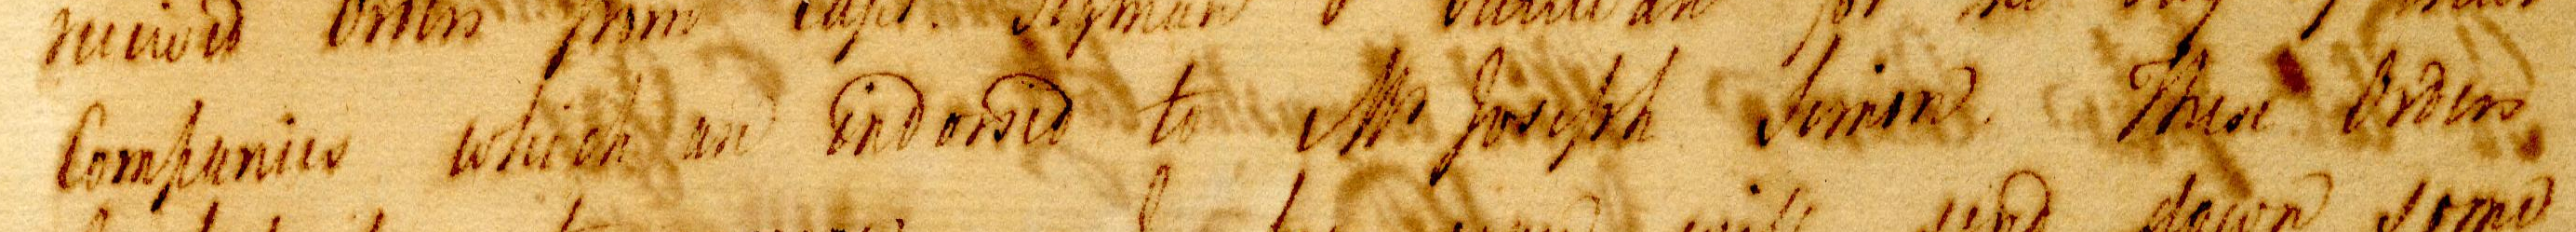Companies which are indorsed to M^r Joseph Simon. These Orders
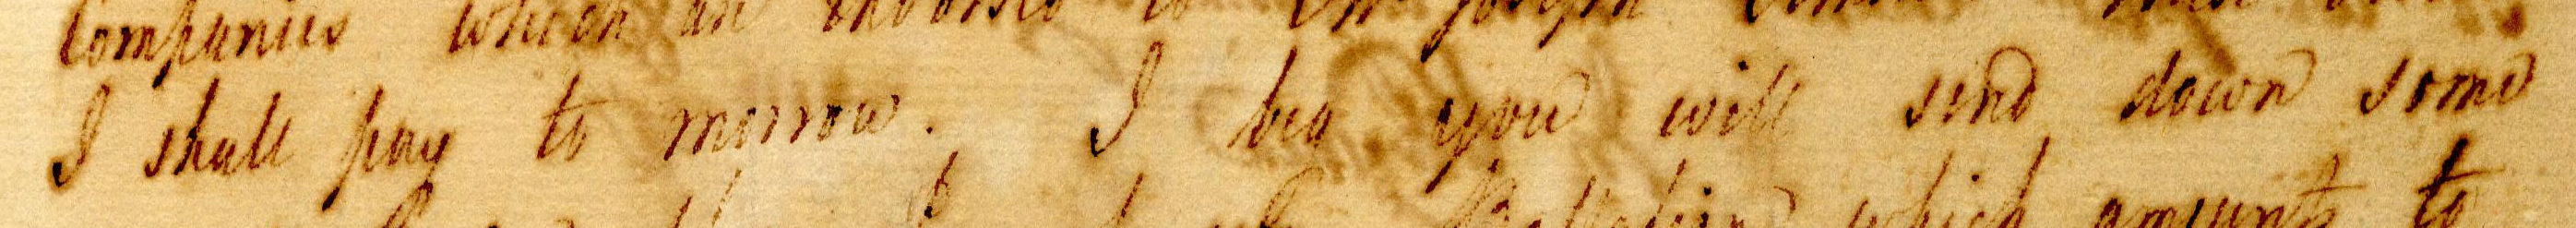I shall pay to morrow. I beg you will send down some
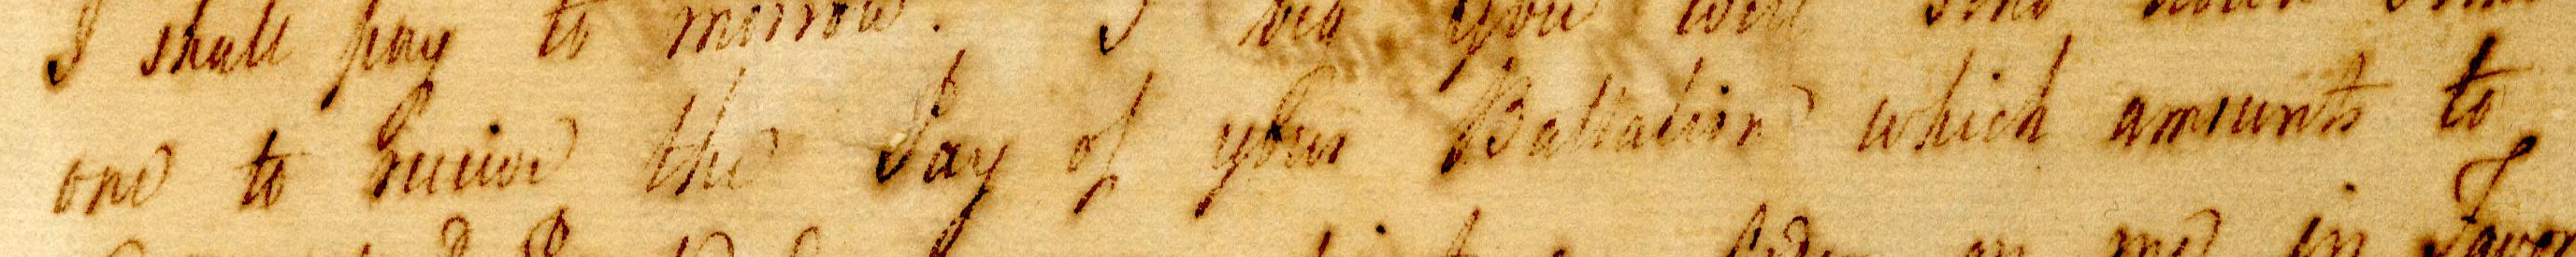one to receive the Pay of your Battalion which amounts to
